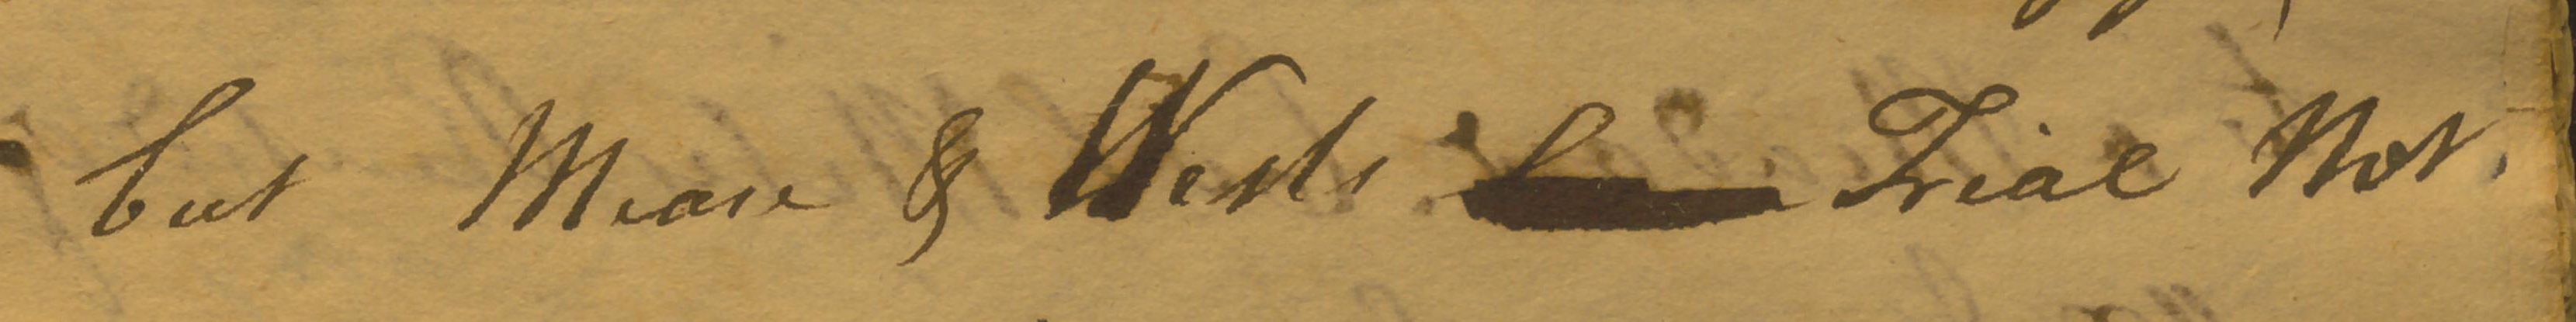but Mease & Wests [____] Trial Not.
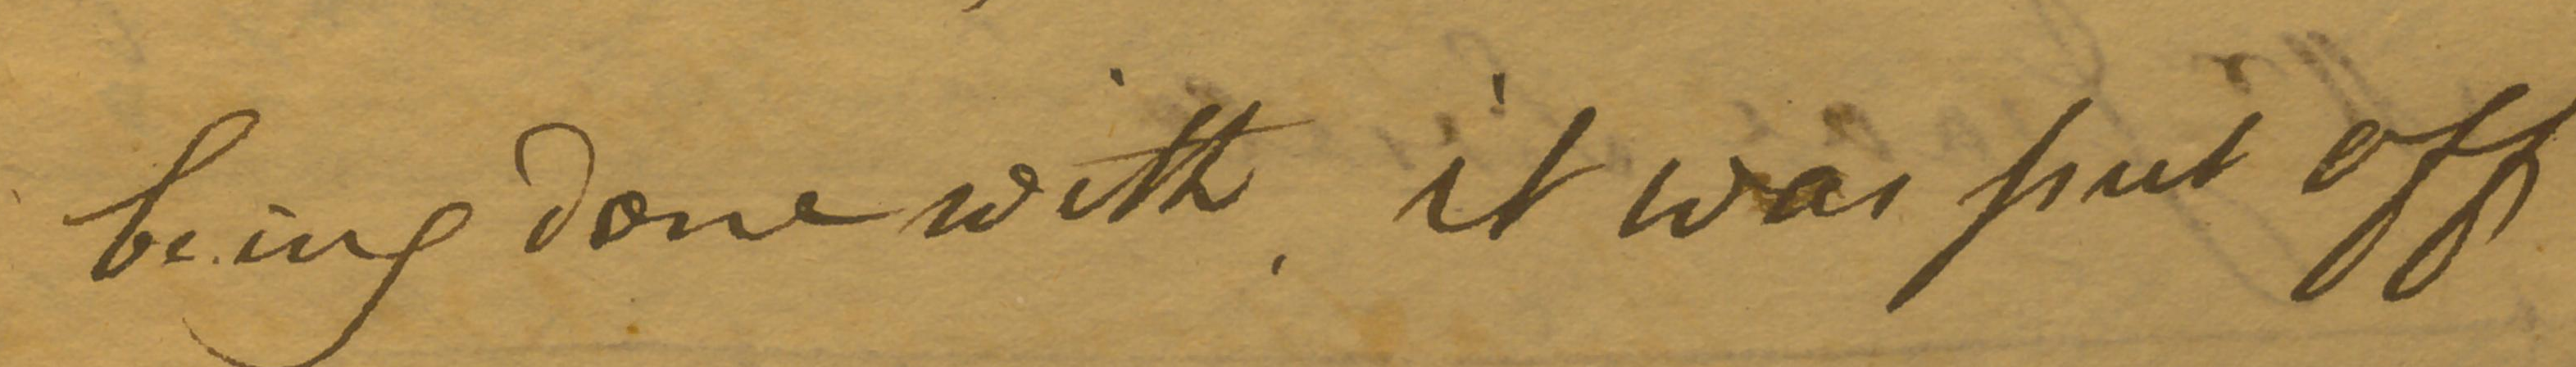being done with it was put off
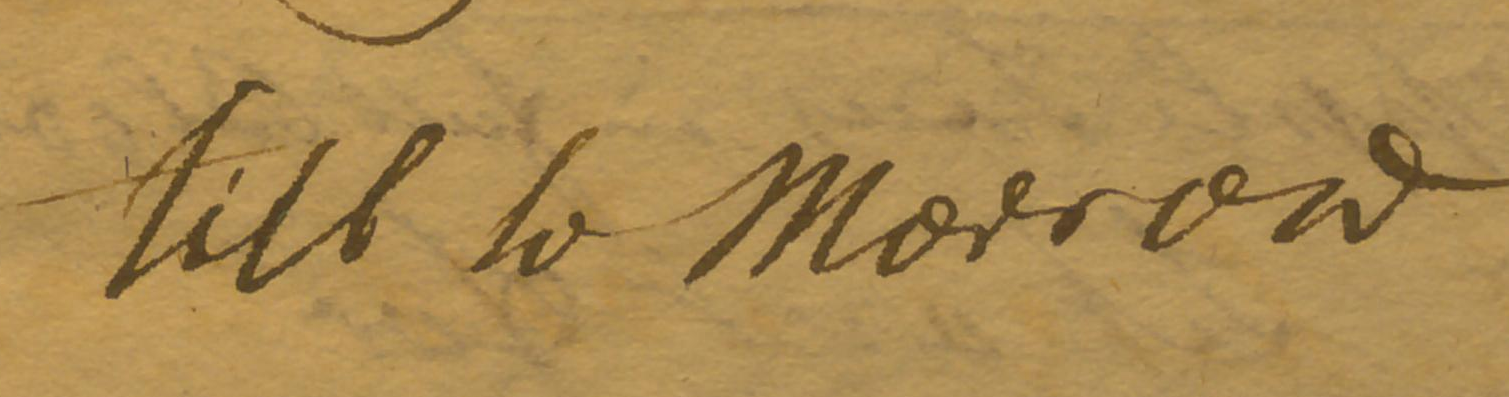till to Morrow
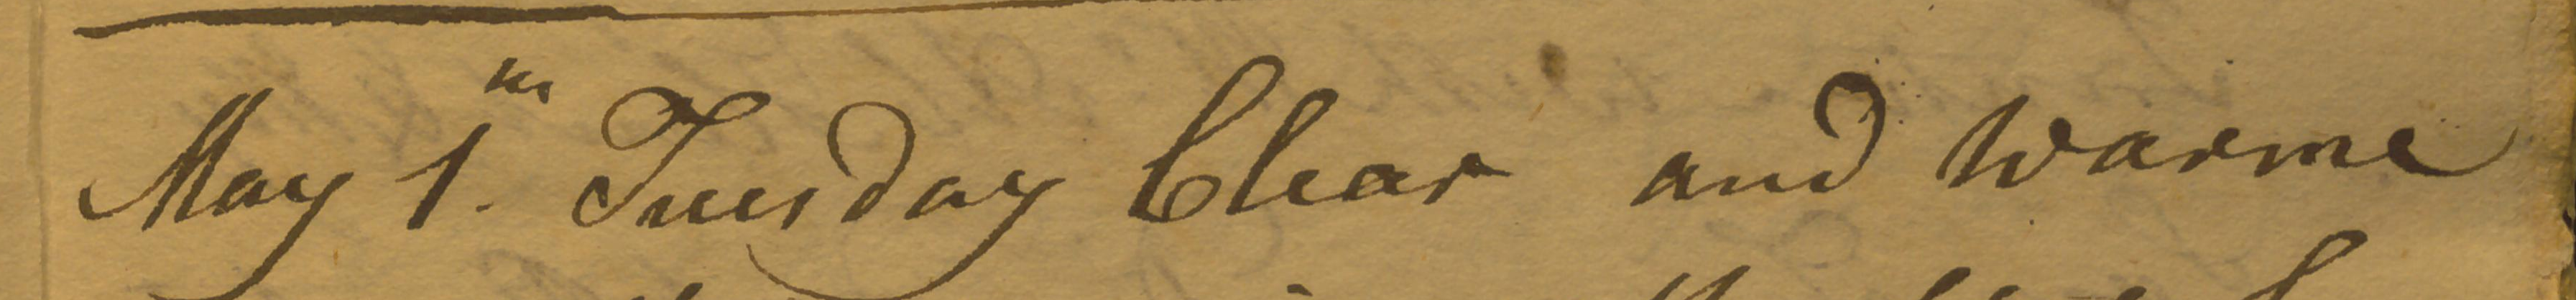May 1^th. Tuesday Clear and warme
